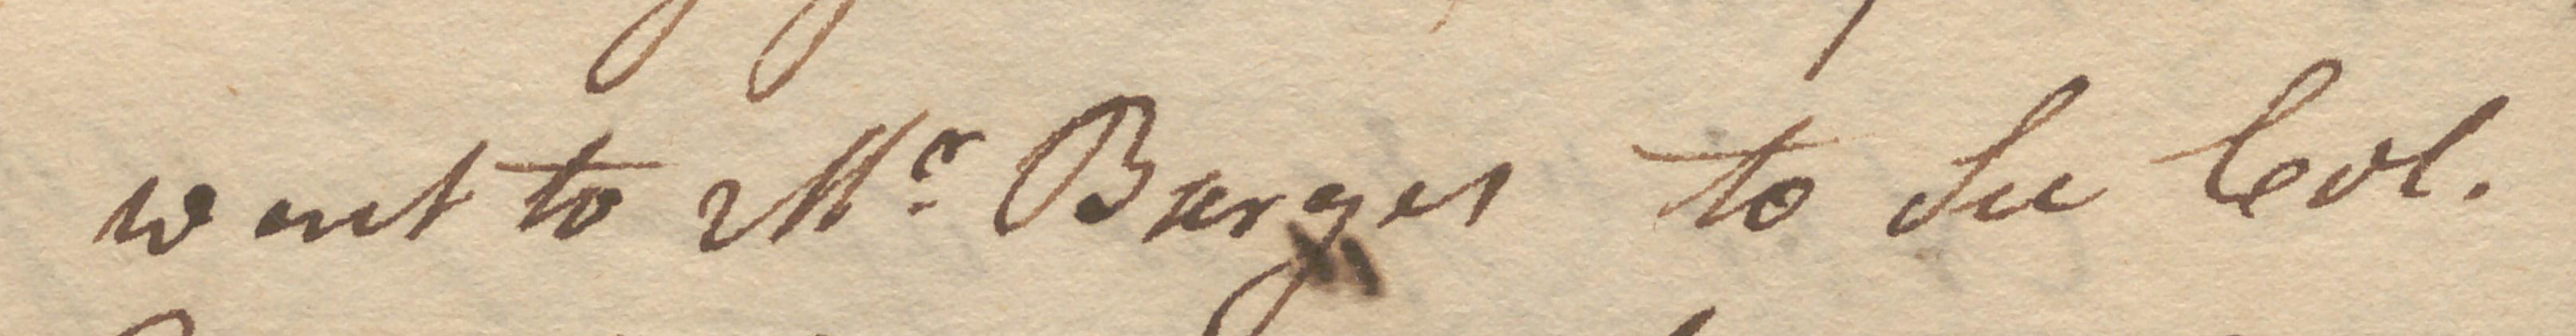went to M^r. Barges to see Col.
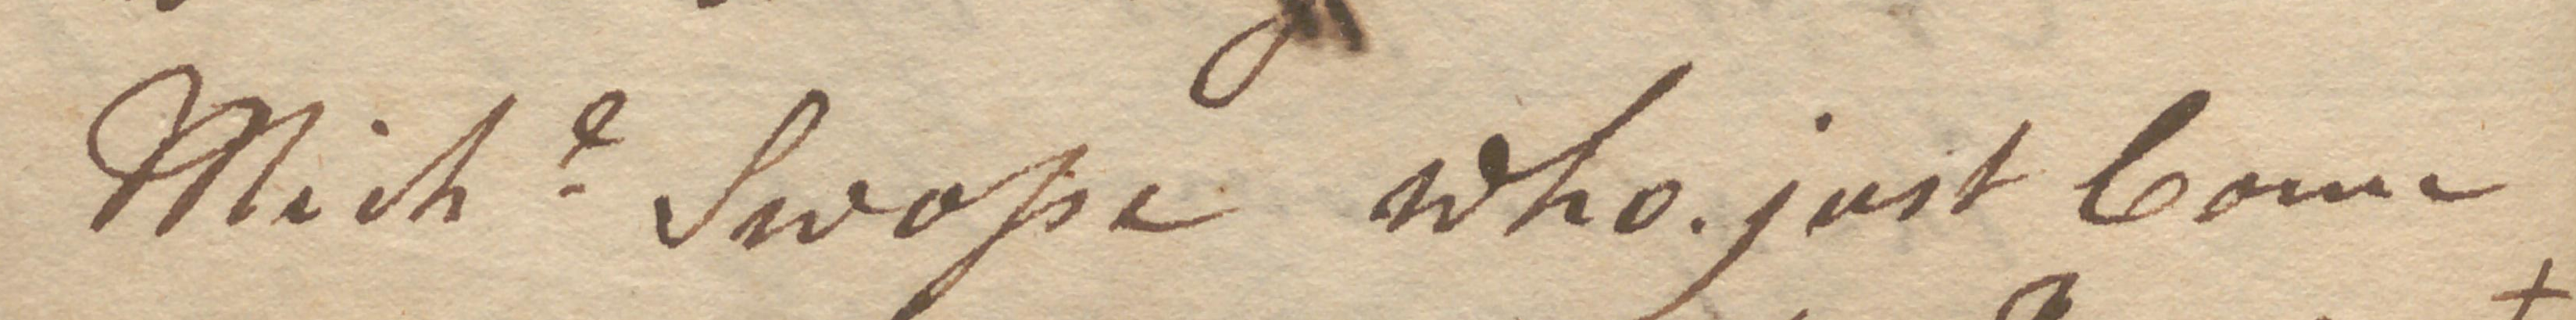Mich^l. Swope who just Come
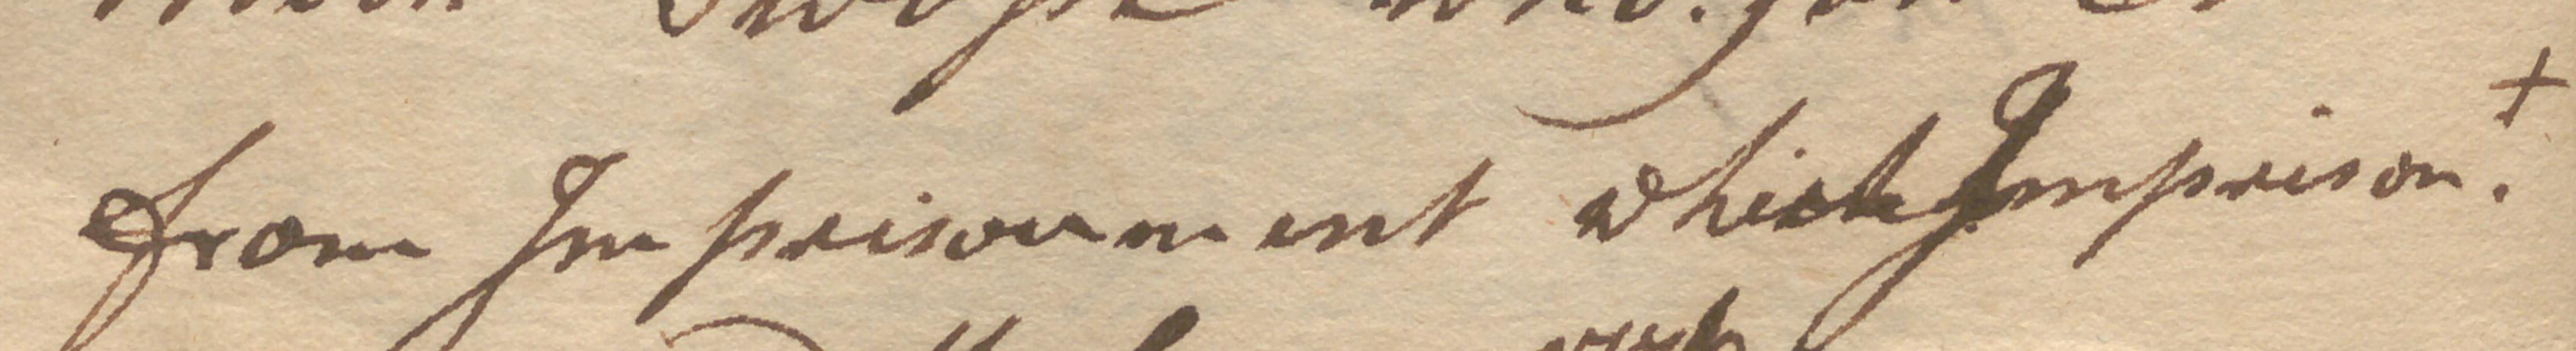from Imprisonment which Imprison^t.
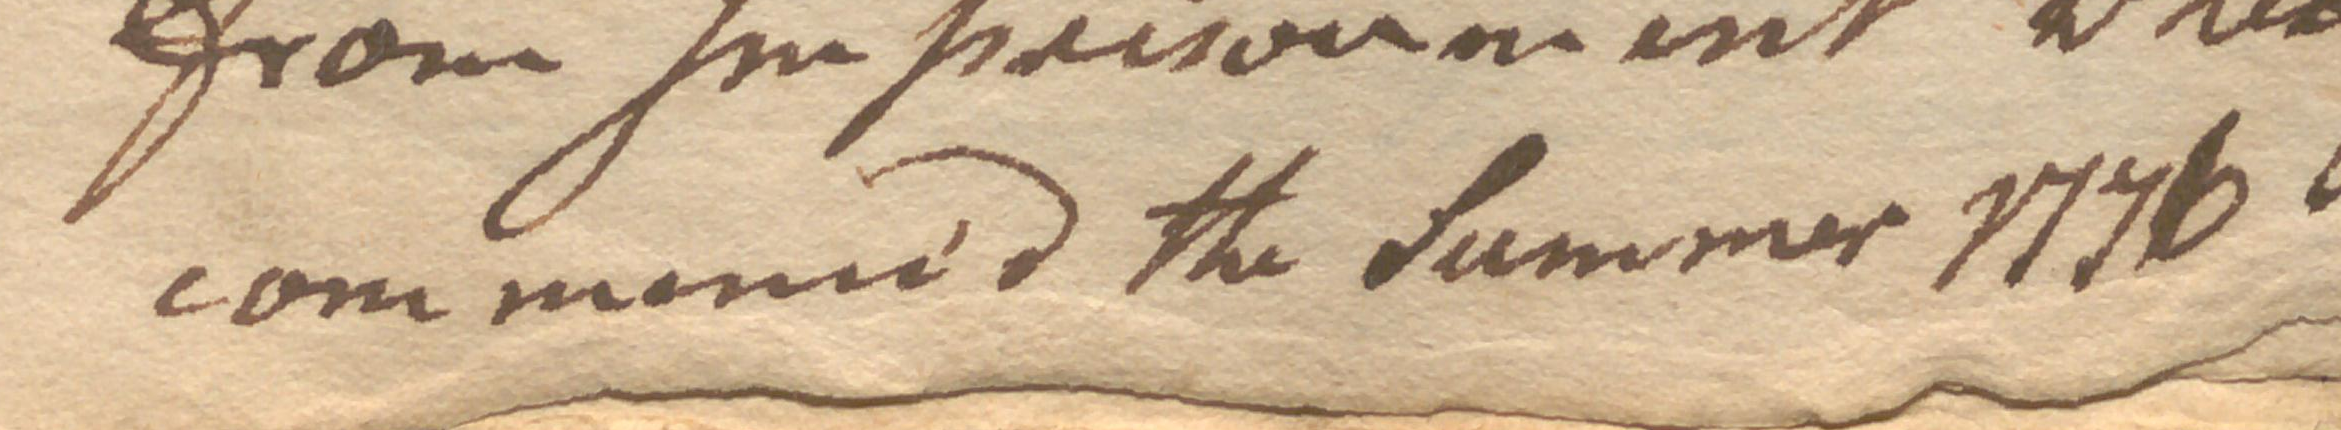commenc'd the Summer 1776
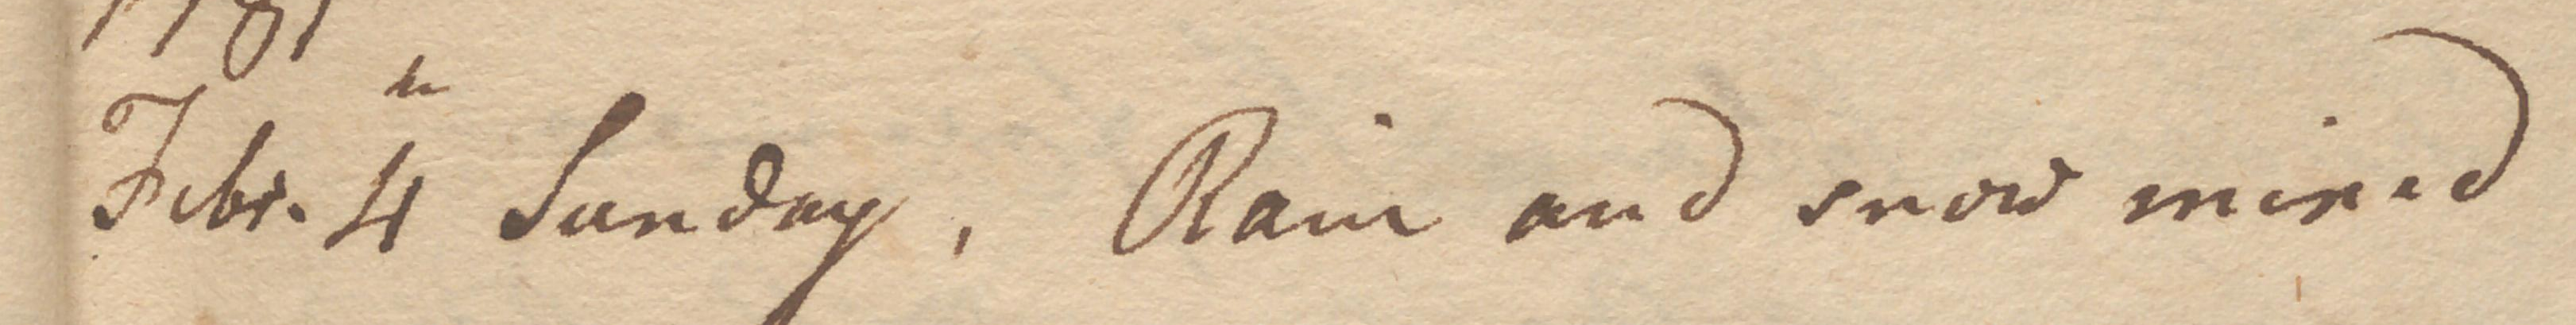Febr. 4^th Sunday. Rain and snow mixed
